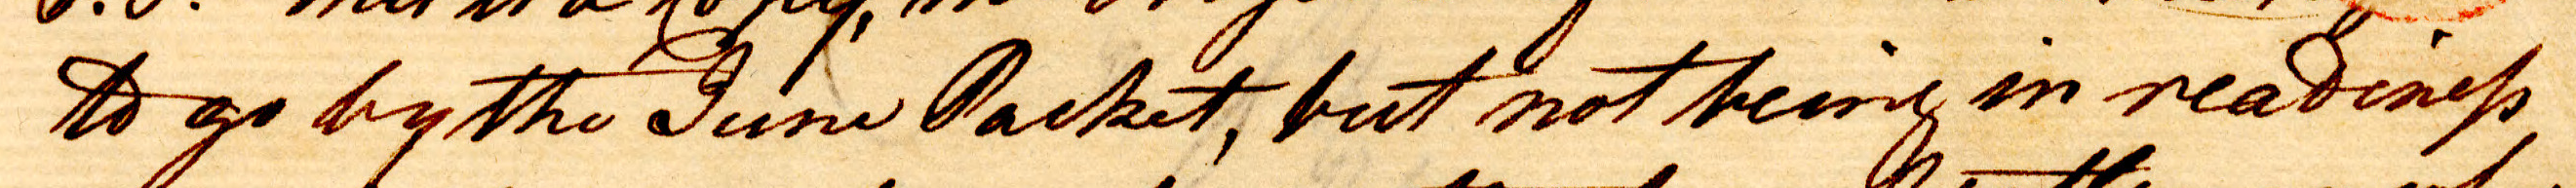to go by the June Packet, but not being in readiness
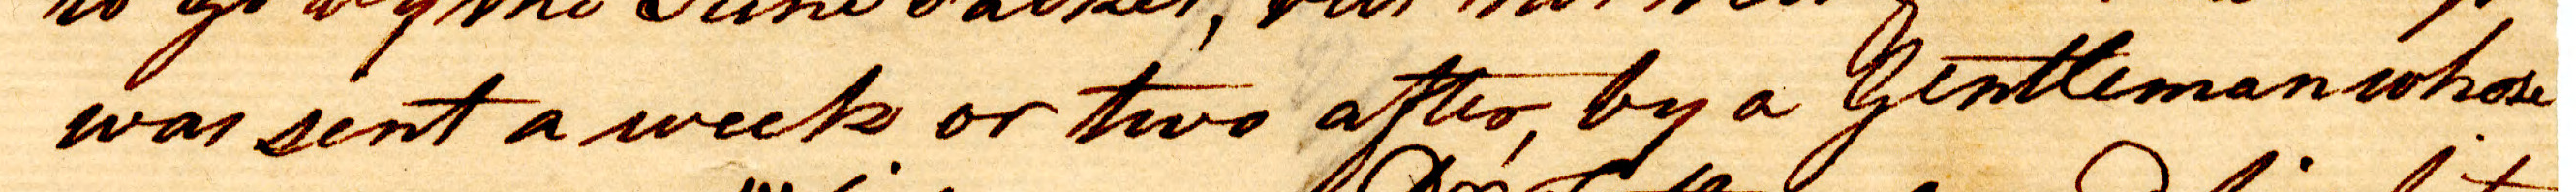was sent a week or two after, by a Gentleman whose
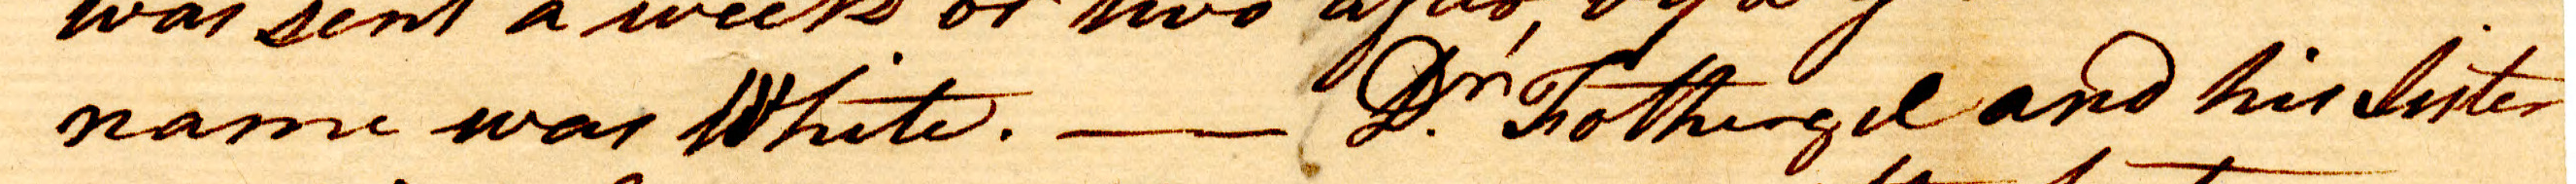name was White.- D^r. Fothergil and his Sister
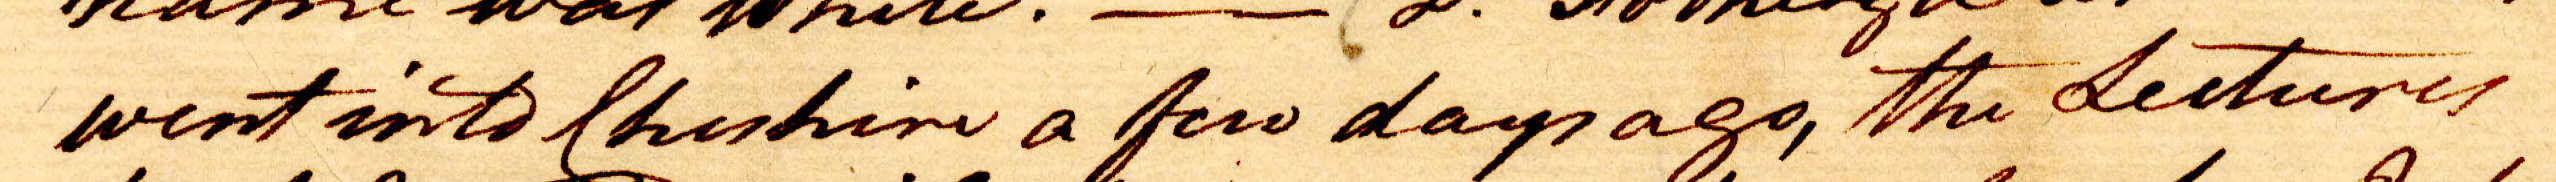went into Cheshire a few days ago, the Lectures
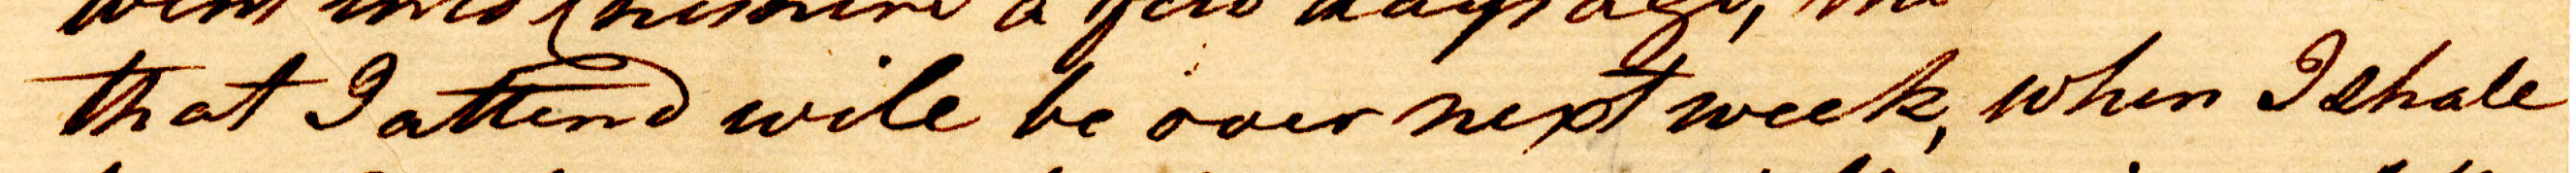that I attend will be over next week, when I shall
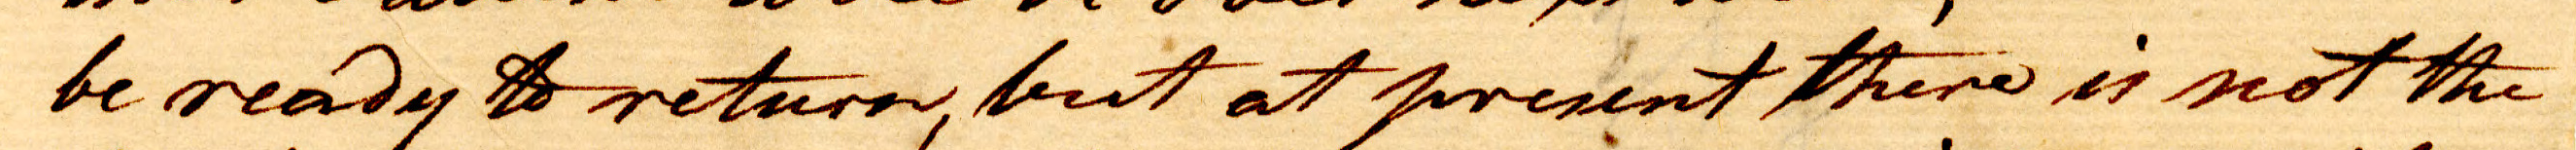be ready to return, but at present there is not the
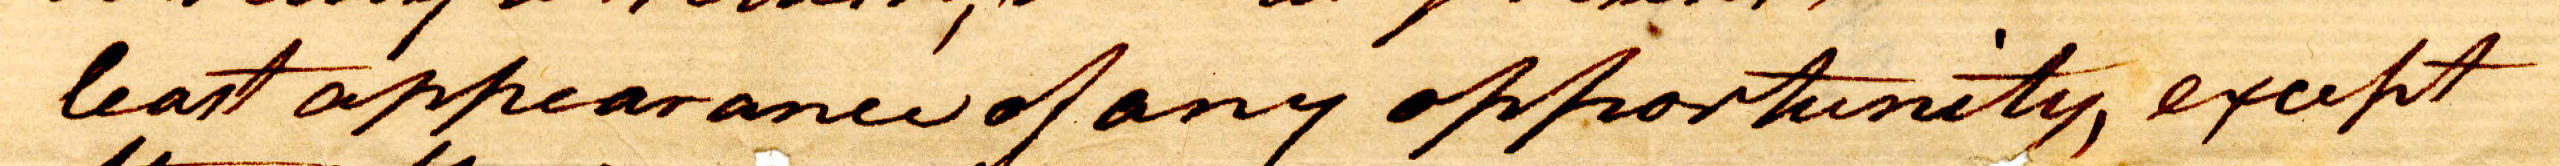least appearance of any opportunity, except
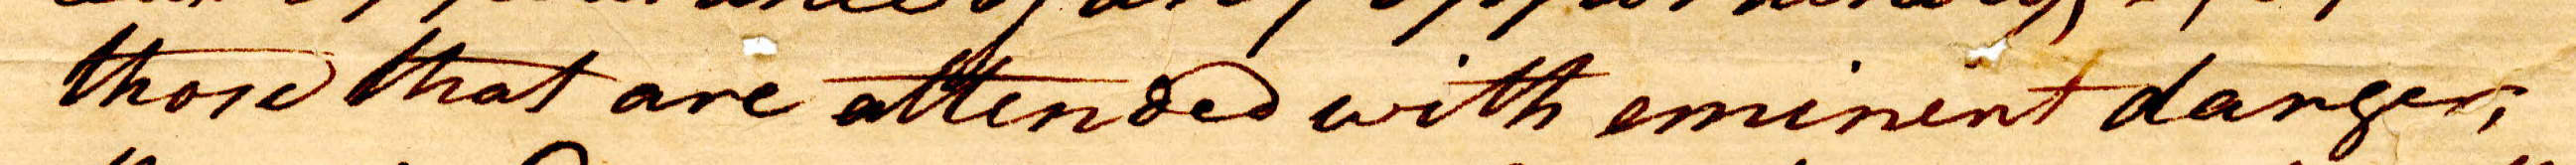those that are attended with eminent danger,
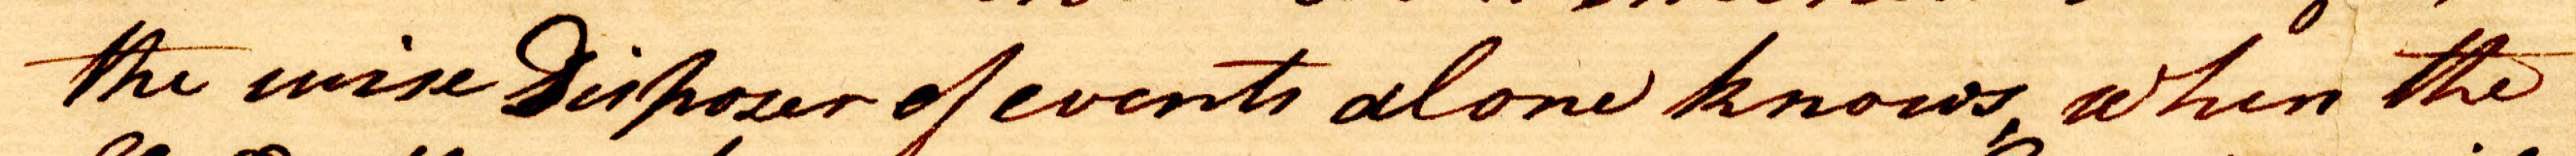the wise Disposer of events alone knows when the
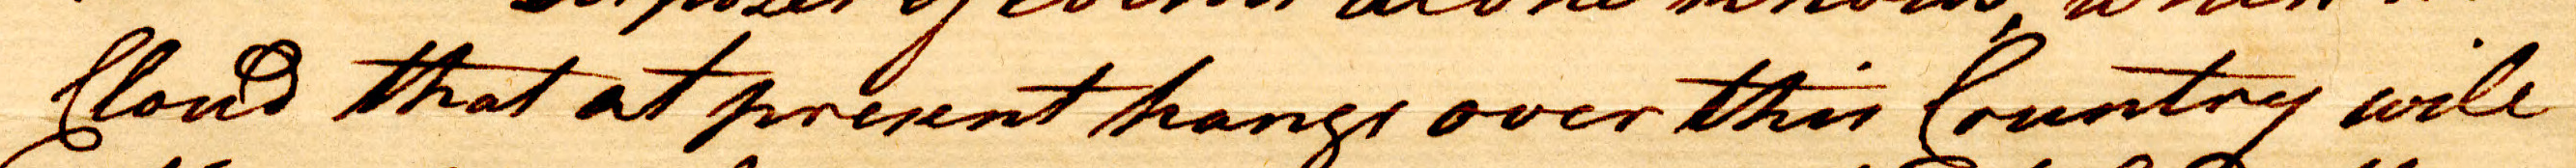Cloud that at present hangs over this Country will
